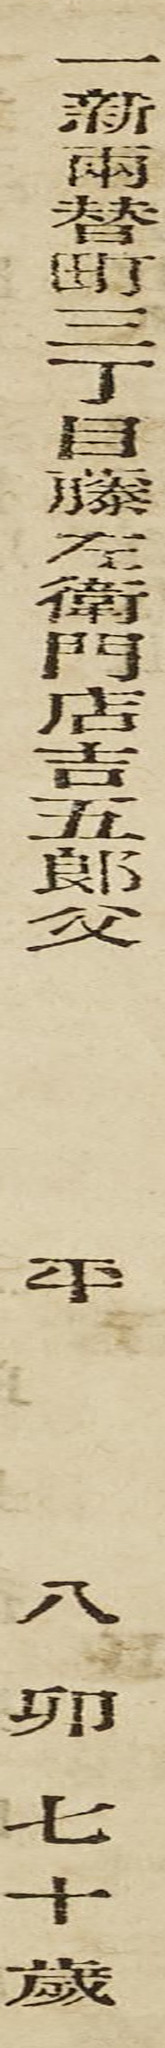一新両替町三丁目藤左衛門店吉五郎父平八卯七十歳
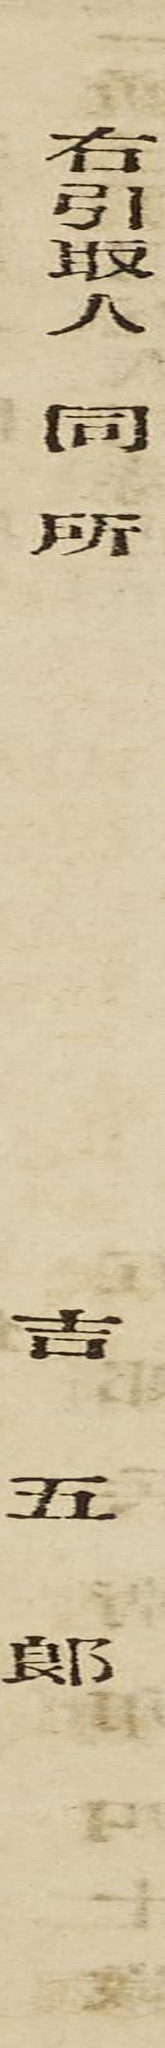右引取人同所吉五郎
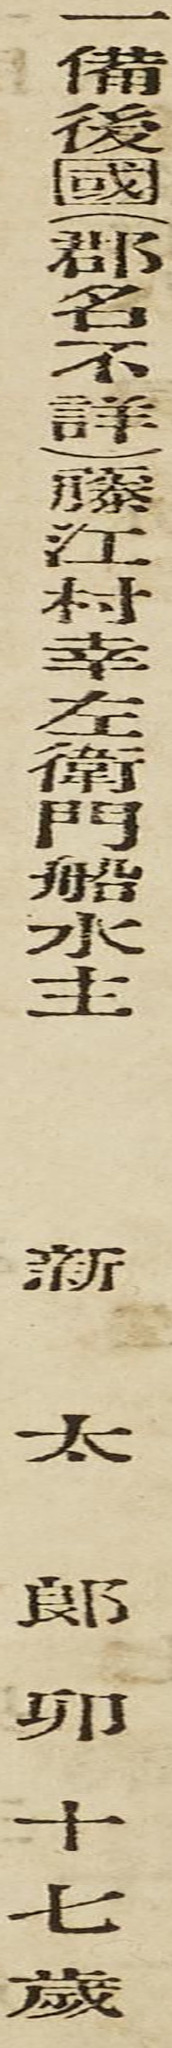一備後国藤江村幸左衛門船水主新太郎卯十七歳
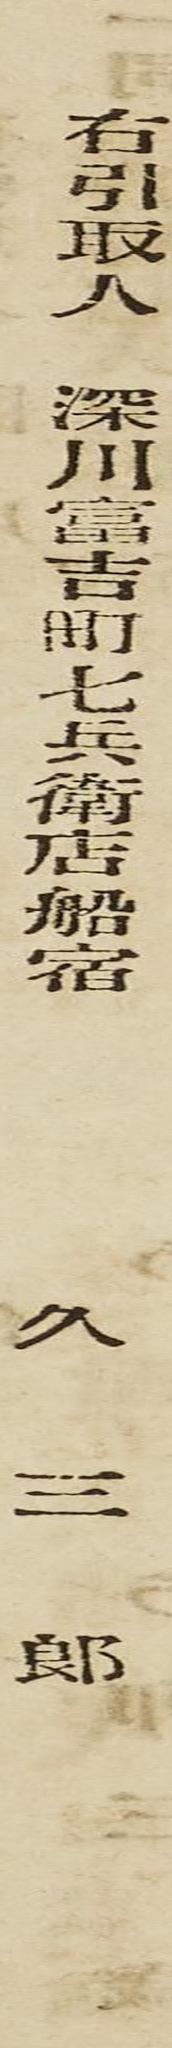右引取人深川冨吉町七兵衛店船宿久三郎
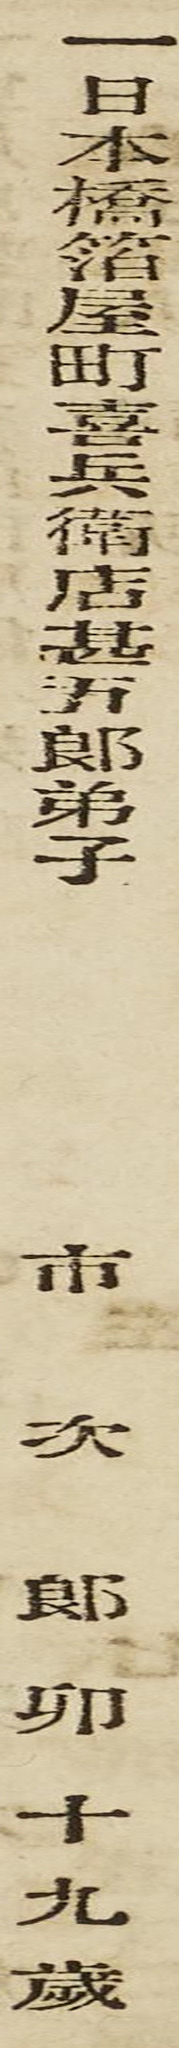一日本橋箔屋町喜兵衛店甚五郎弟子市次郎卯十九歳
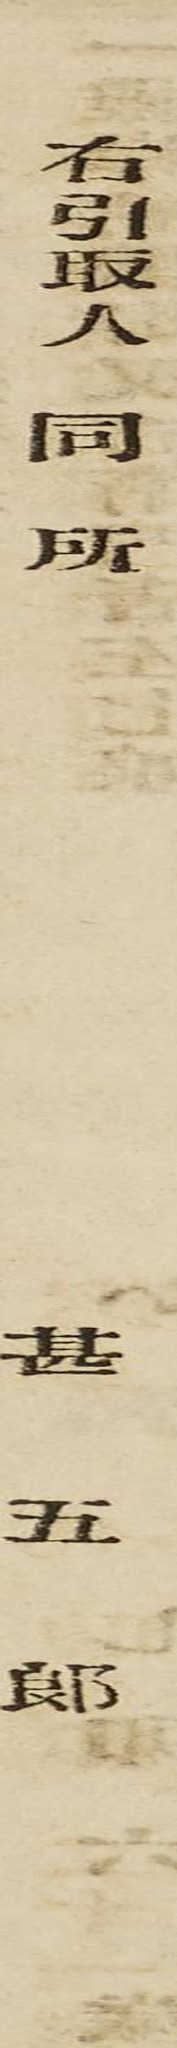右引取人同所甚五郎
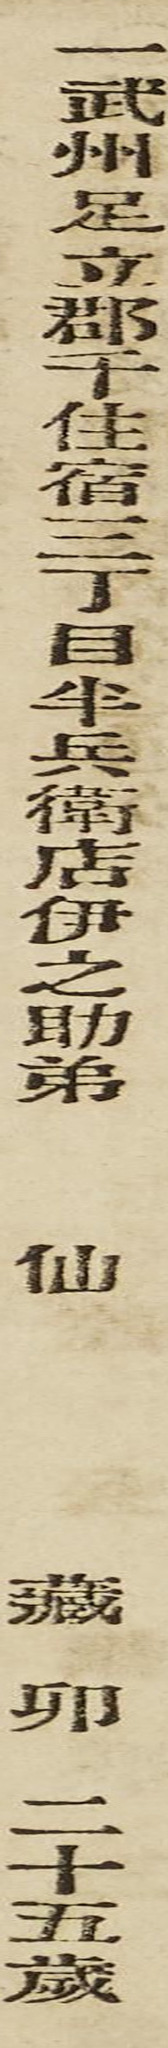一武州足立郡千住宿三丁目半兵衛店伊之助弟仙蔵卯二十五歳
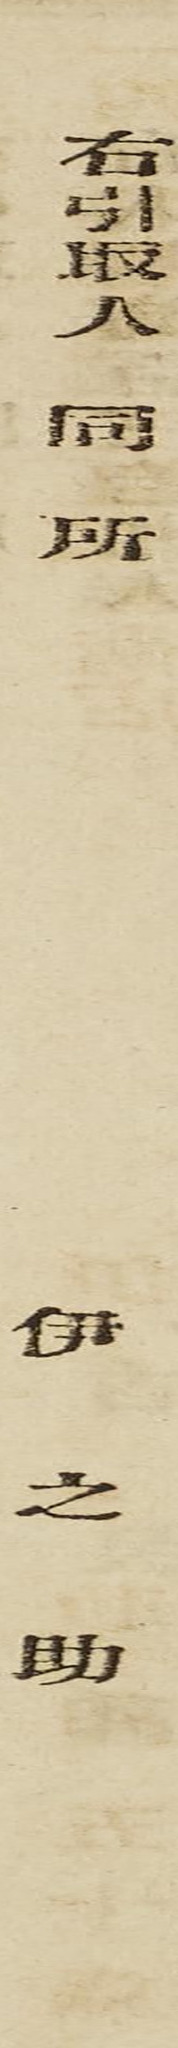右引取人同所伊之助
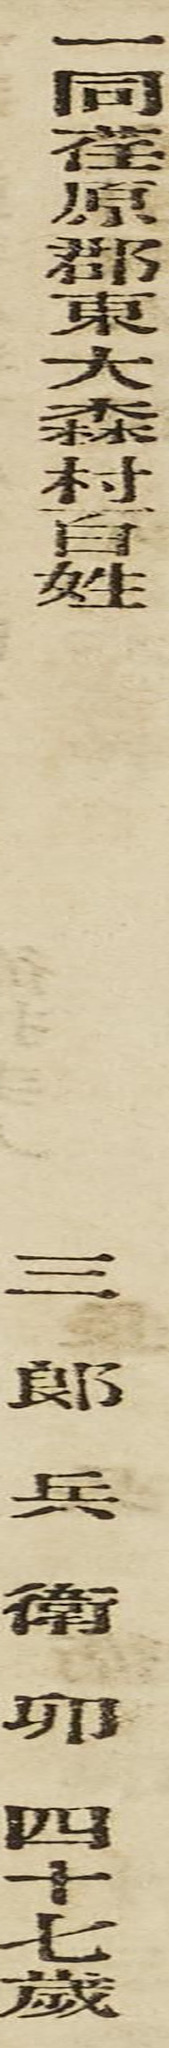一同荏原郡東大森村百姓三郎兵衛卯四十七歳
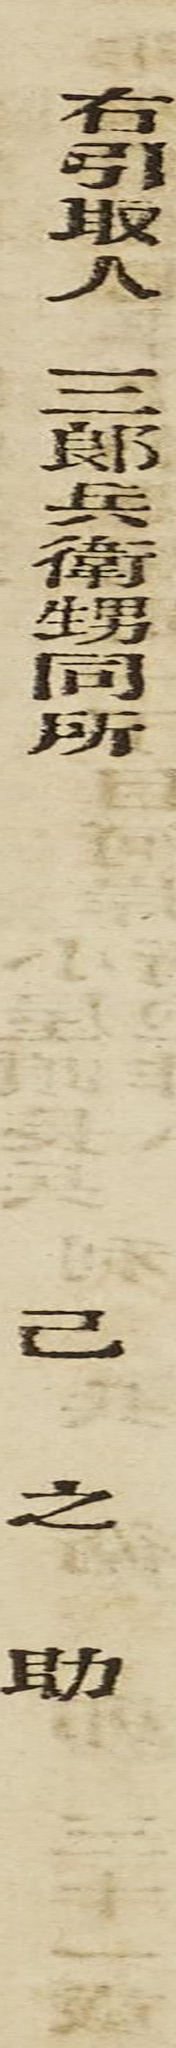右引取人三郎兵衛甥同所己之助
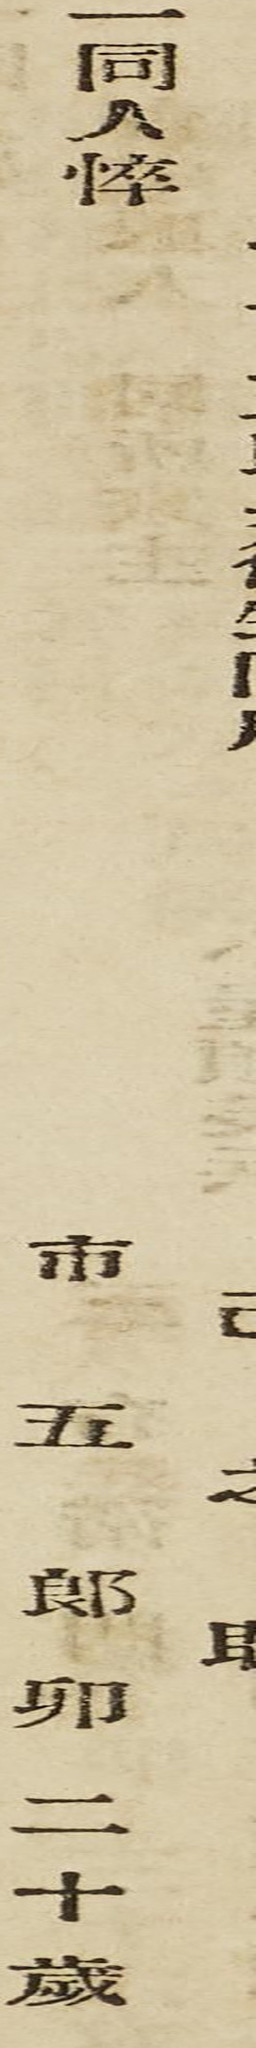一同人倅市五郎卯二十歳
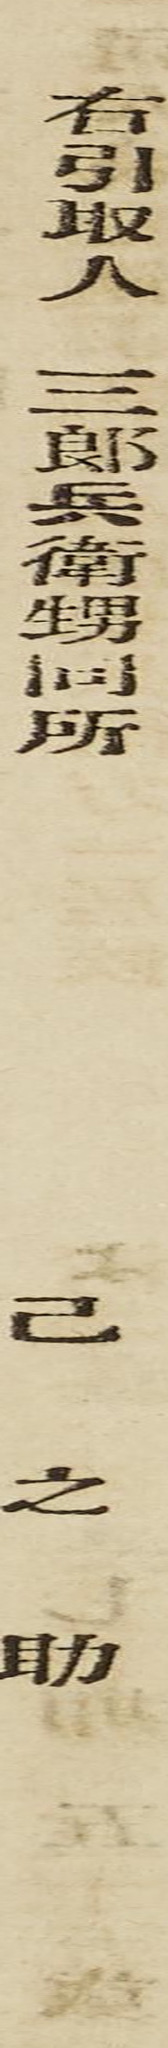右引取人三郎兵衛甥同所己之助
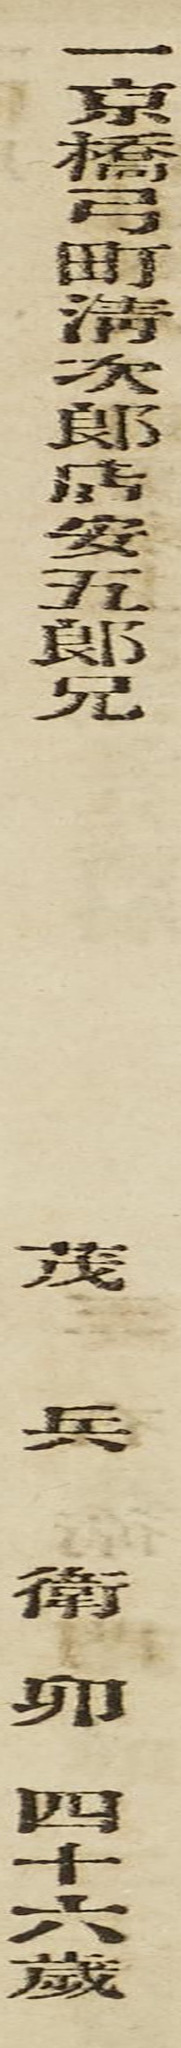一京橋弓町清次郎店安五郎兄茂兵衛卯四十六歳
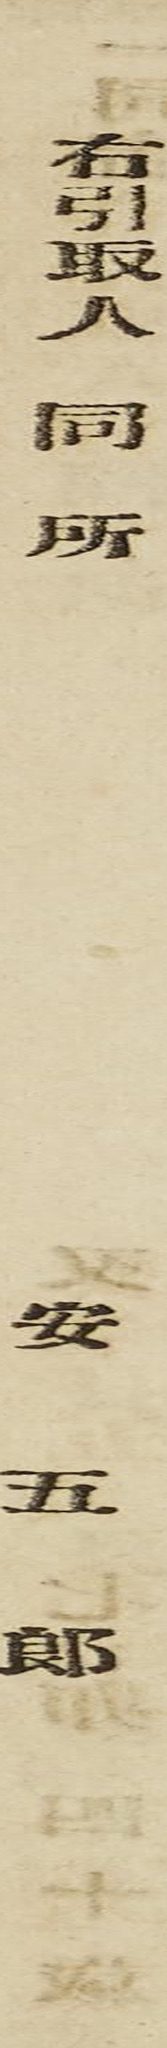右引取人同所安五郎
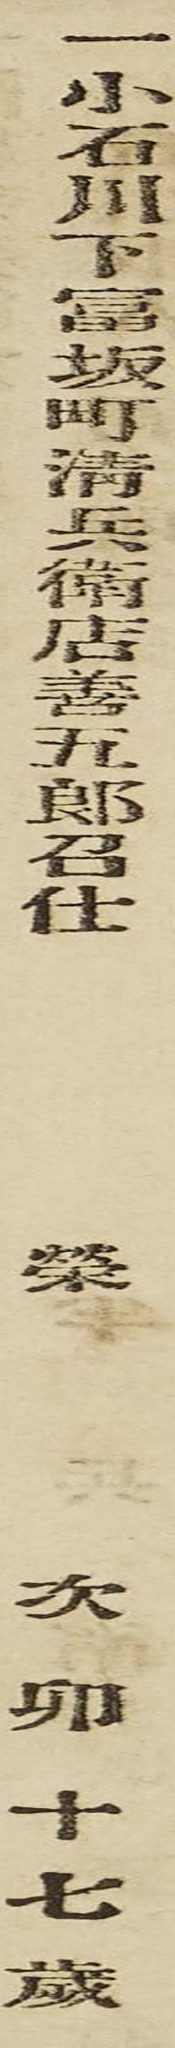一小石川下冨坂町清兵衛店善五郎召仕栄次卯十七歳
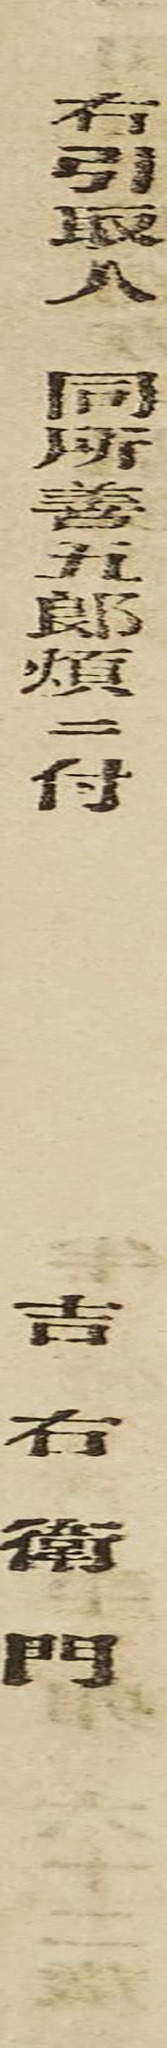右引取人同所善五郎煩ニ付吉右衛門
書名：永代惨話　文化の夢　全
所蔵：東京大学地震研究所図書室 Earthquake Research Institute Library, The University of Tokyo, JAPAN
